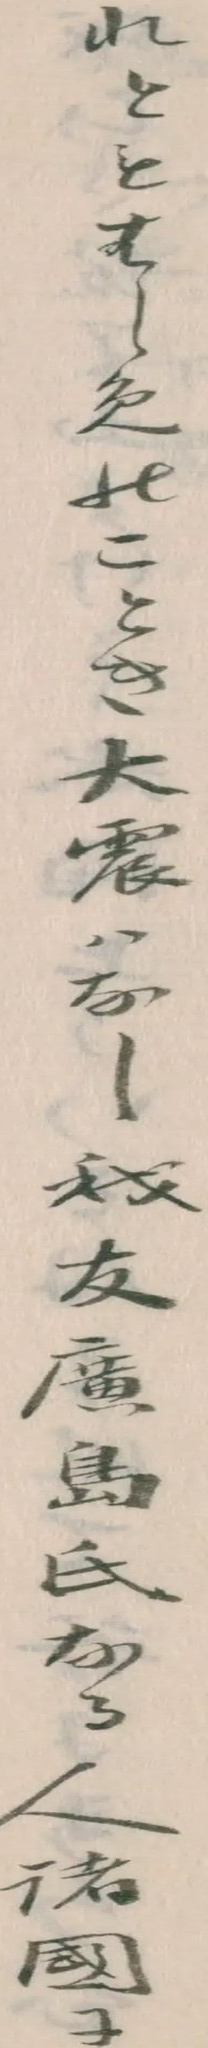れともはしめのことき大震はなし我友広島氏なる人諸国に
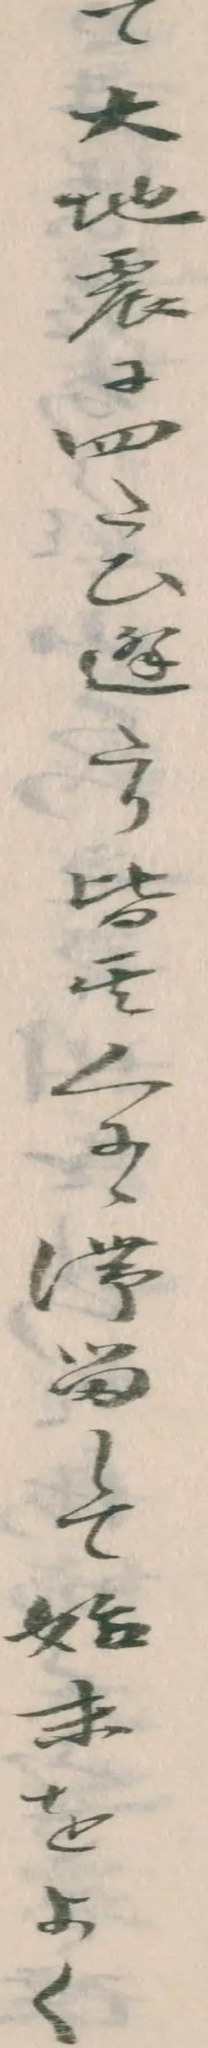て大地震に四たひ逢たり皆其くにゝ滞留して始末をよく
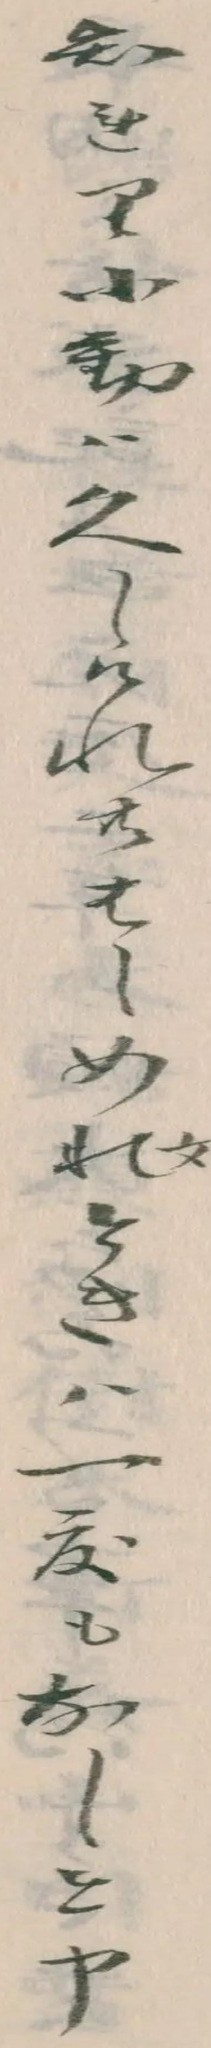知れり小動は久しけれ共はしめのときは一度もなしと申
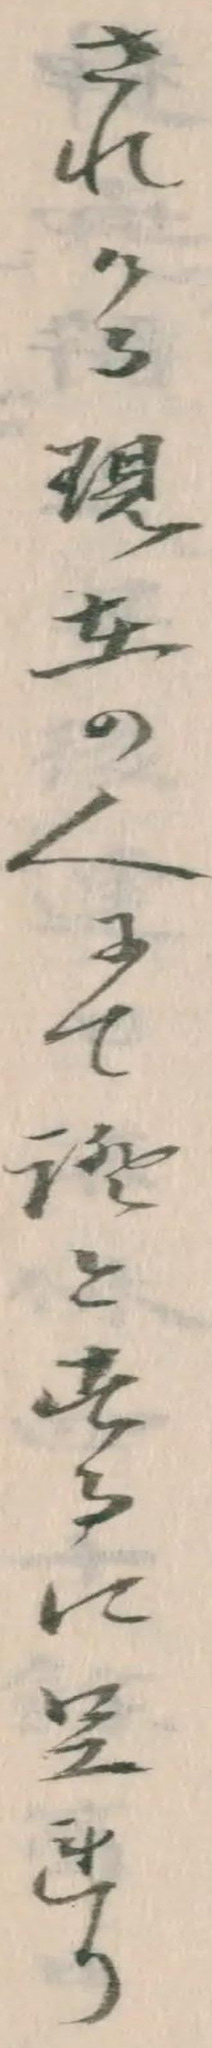されける現在の人にて証とするに足れり
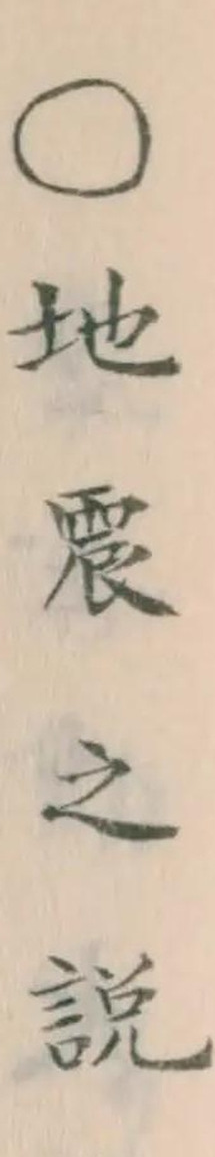○地震之説
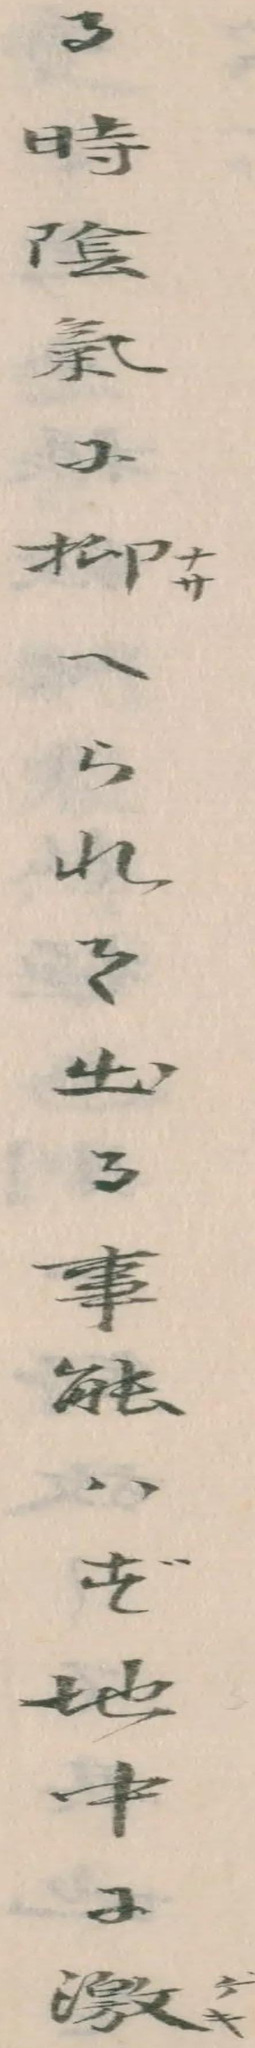る時陰気に抑へられて出る事能はず地中に激
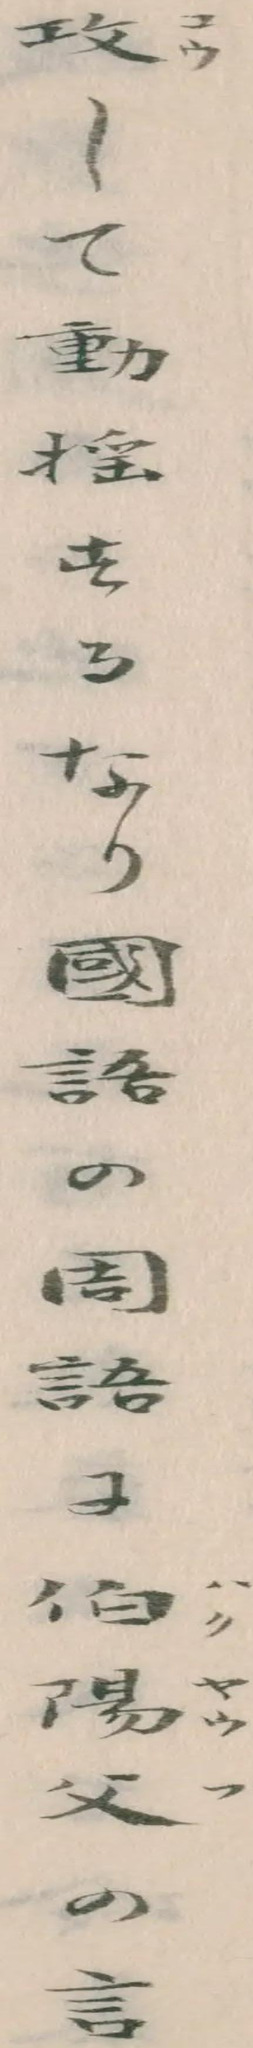攻して動揺するなり国語の周語に伯陽父の言
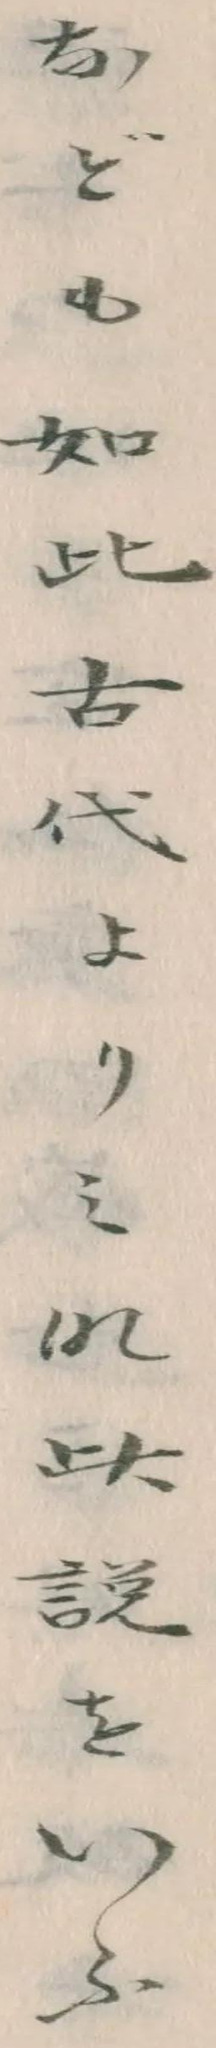なども如此古代よりみな此説をいふ
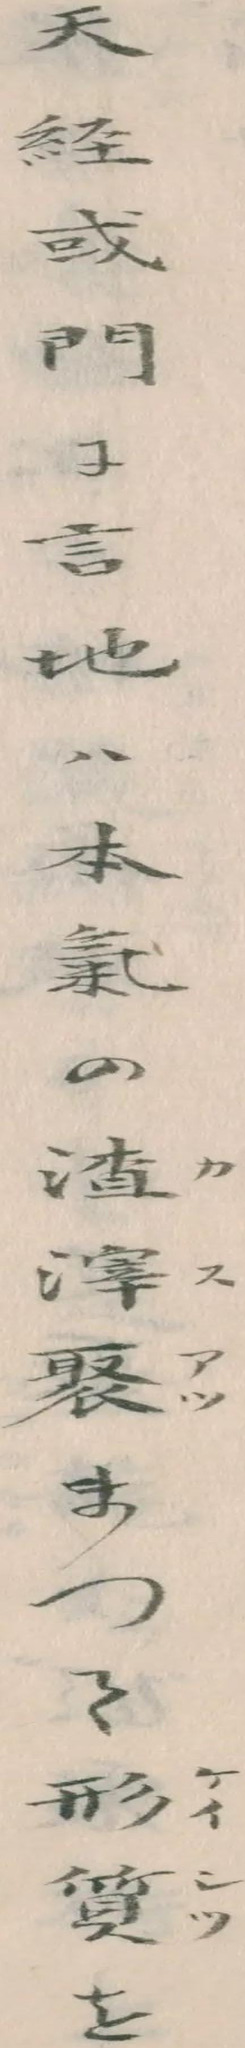天経或門に言地は本気の渣滓聚まつて形質を
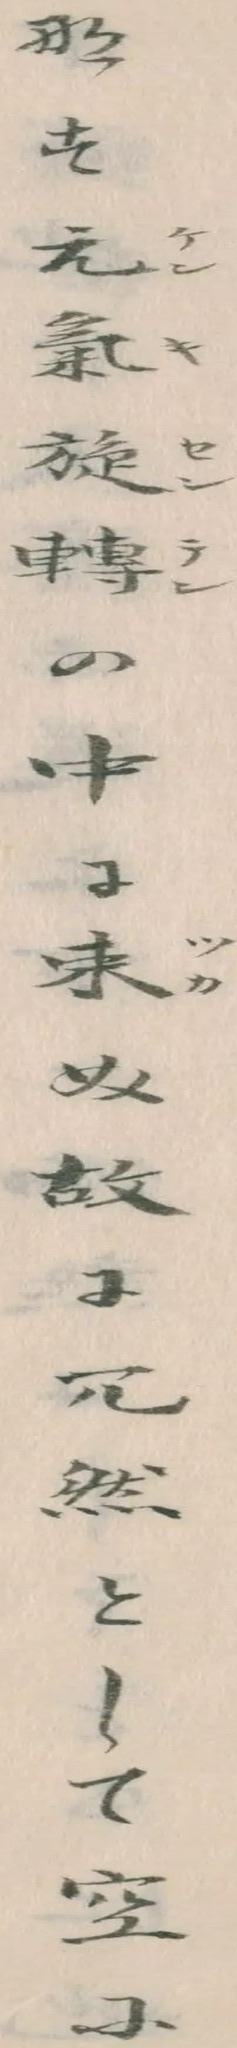なす元気旋転の中に束ぬ故に兀然として空に
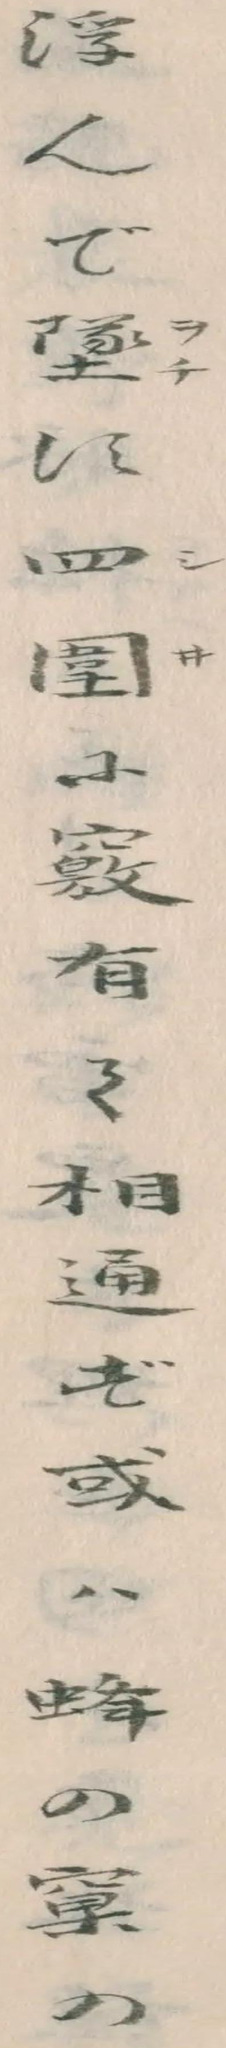浮んで墜す四囲に竅有て相通ず或は蜂の巣の
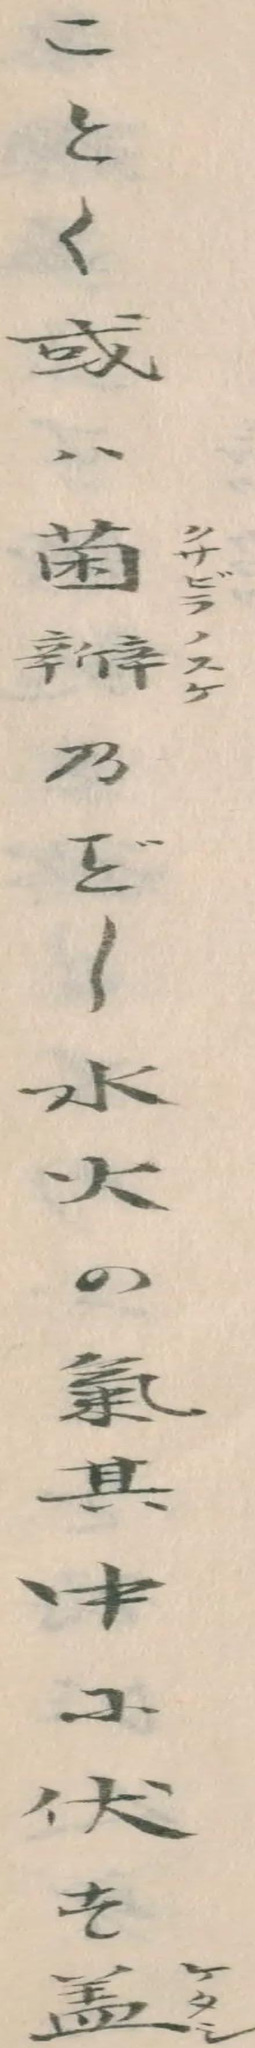ことく或は菌瓣のごとし水火の気其中に伏す蓋

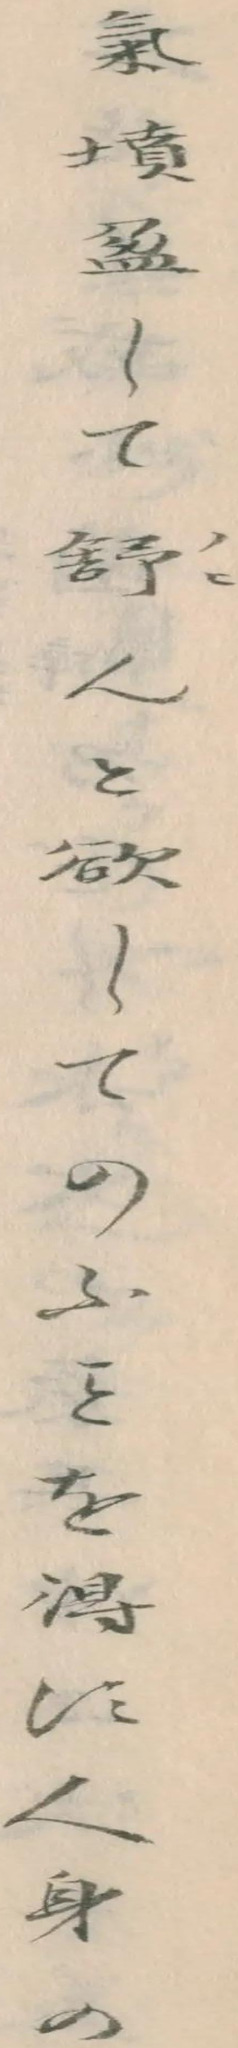気噴盈して舒んと欲してのふことを得す人身の
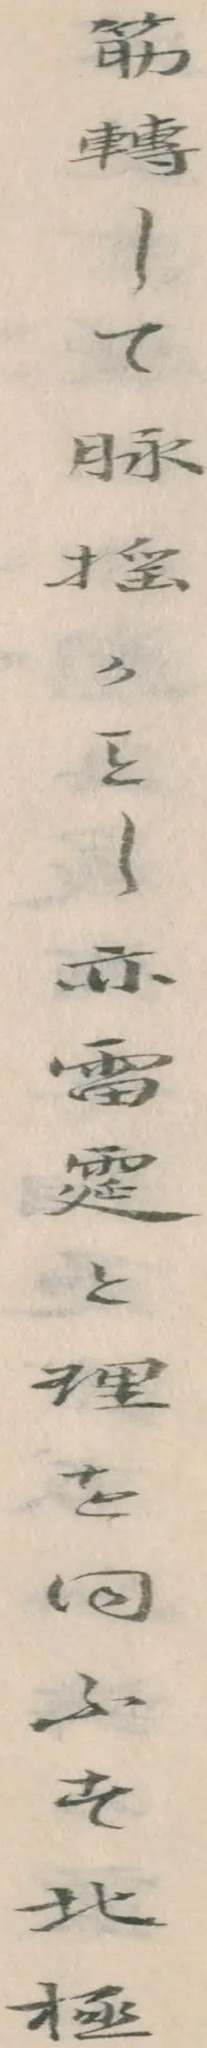筋転して脈揺かことし亦雷霆と理を同ふす北極
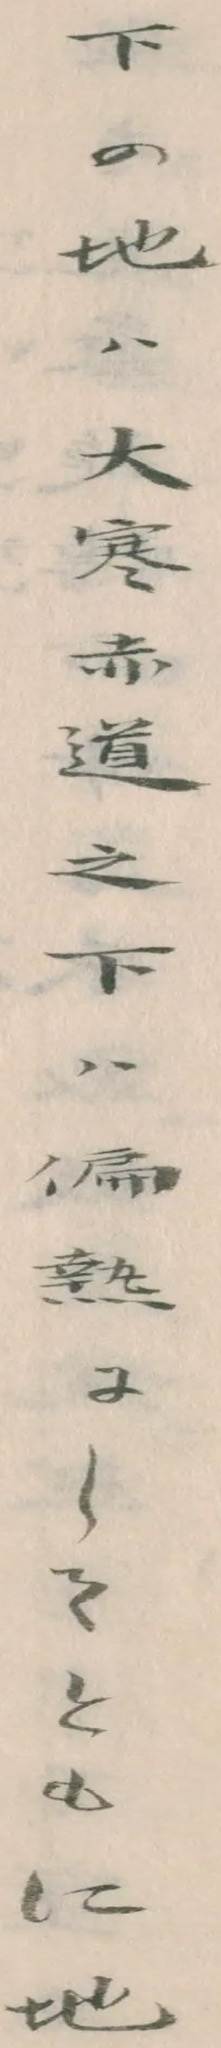下の地は大寒赤道之下は偏熱にしてともに地
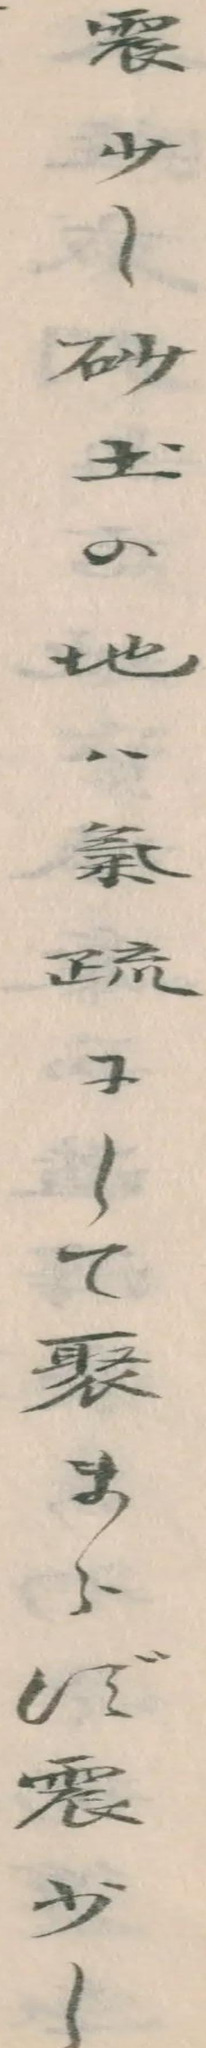震少し砂土の地は気疎にして聚まらず震少し
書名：地災撮要. 巻11-12(地震之部)
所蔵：国立国会図書館 National Diet Library, JAPAN
